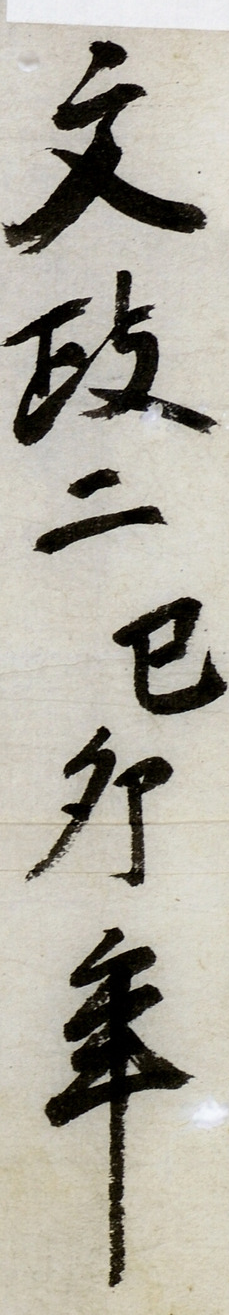文政二己卯年
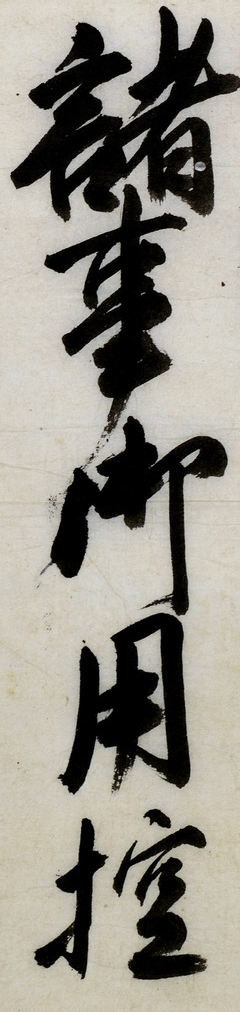諸事御用控
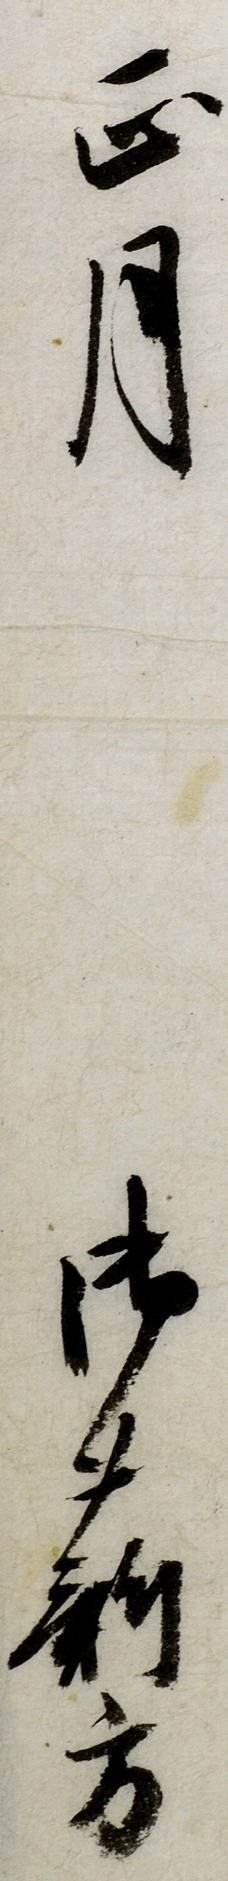正月御薪方
